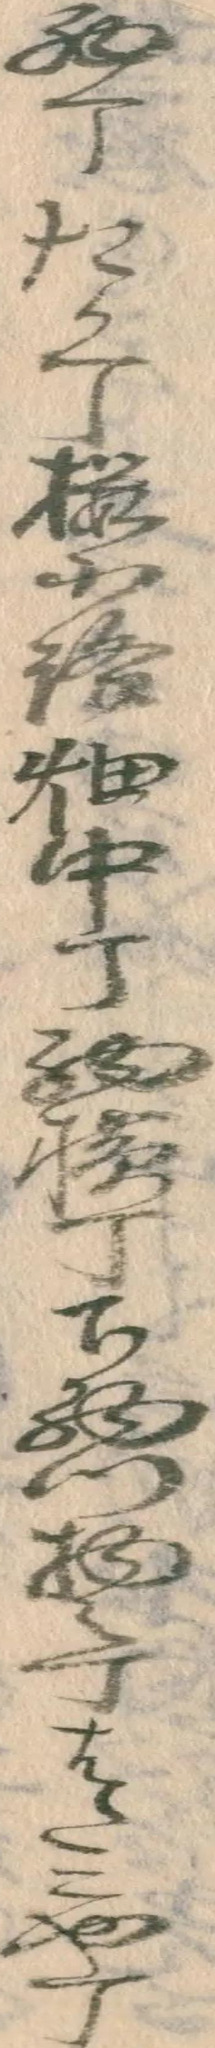西丁たか丁桜小路畑中丁西横丁下西川西丁はたこや丁
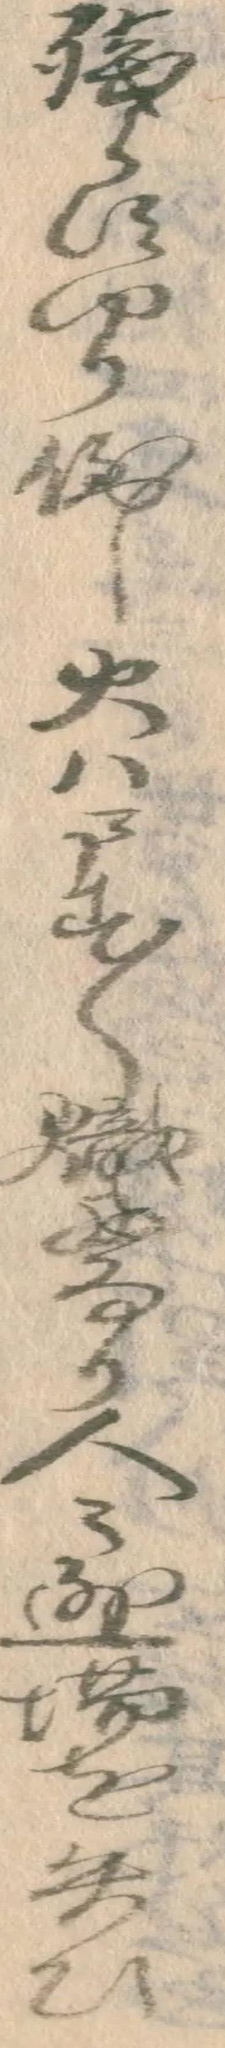残らすゆり倒し火ハます〳〵熾ゆなり人々逃場を失ひ
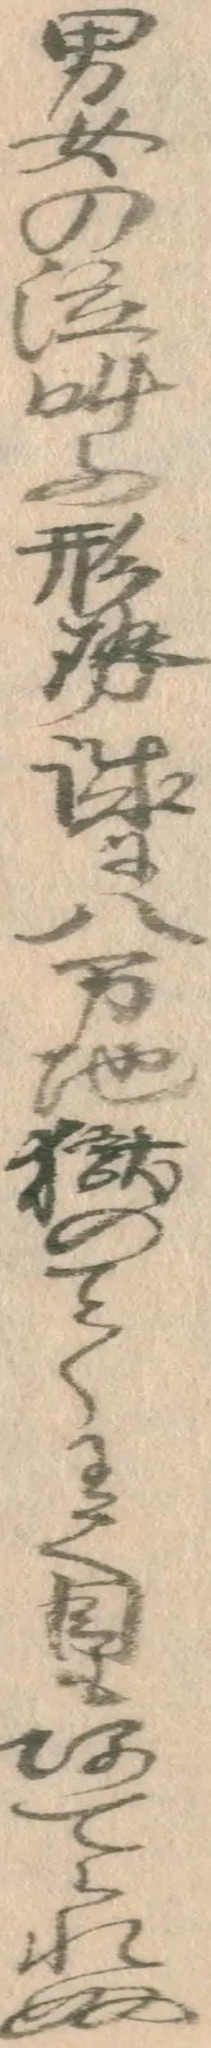男女の泣叫ふ形勢殊に八方地獄のことくにて目もあてられぬ
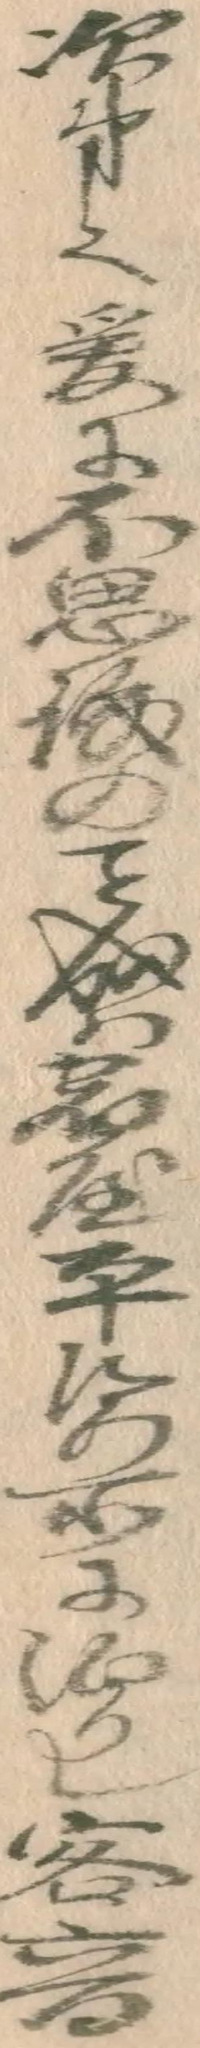次第也爰に不思議のこと成ハ宿屋平左衛門所に泊りし客六百
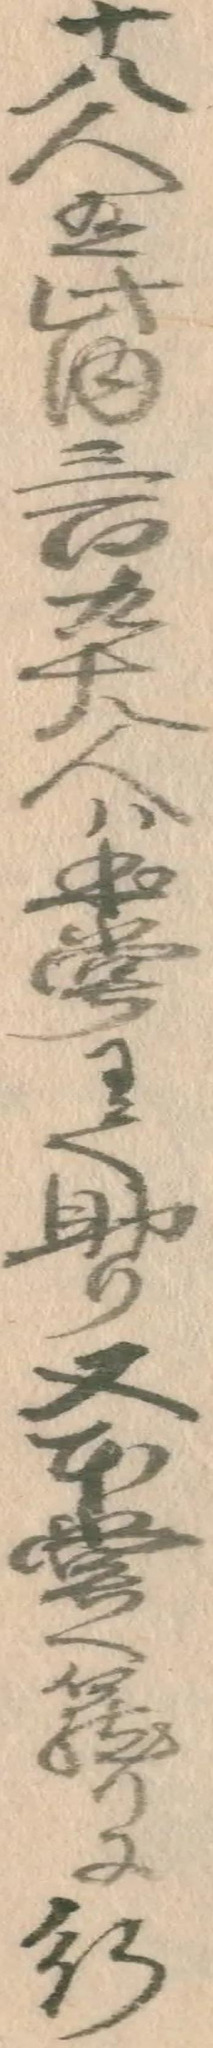十八人有此内三百九十八人ハ本堂にて助り又本堂へ篭りに行
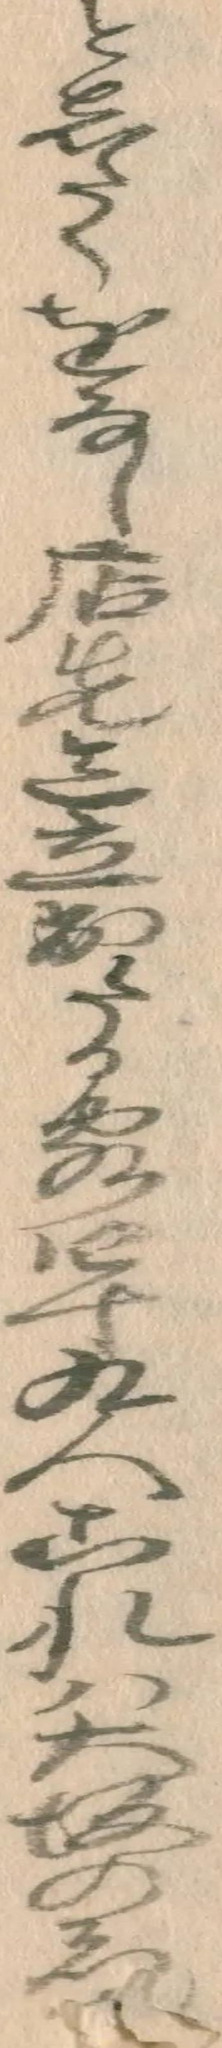としたくをなし店先迄立出たる処四十九人これハ大坂の者
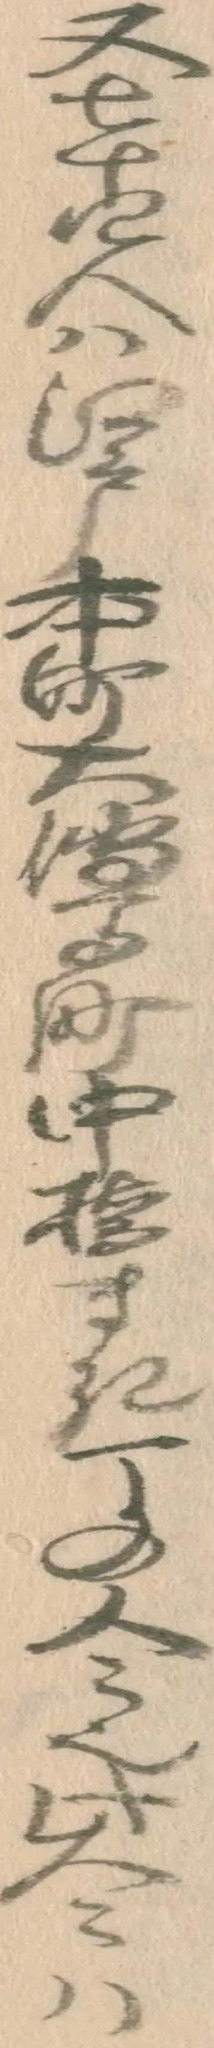又七十四人ハ江戸本町大伝馬町中まき丁の人々也此人々ハ
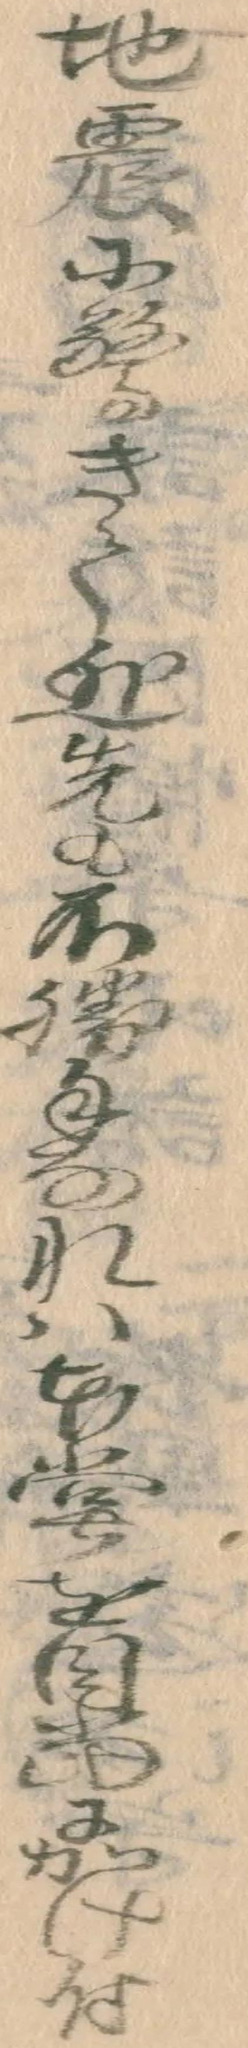地震に驚きて逃先も不勝手なれハ本堂を目当にかけ付
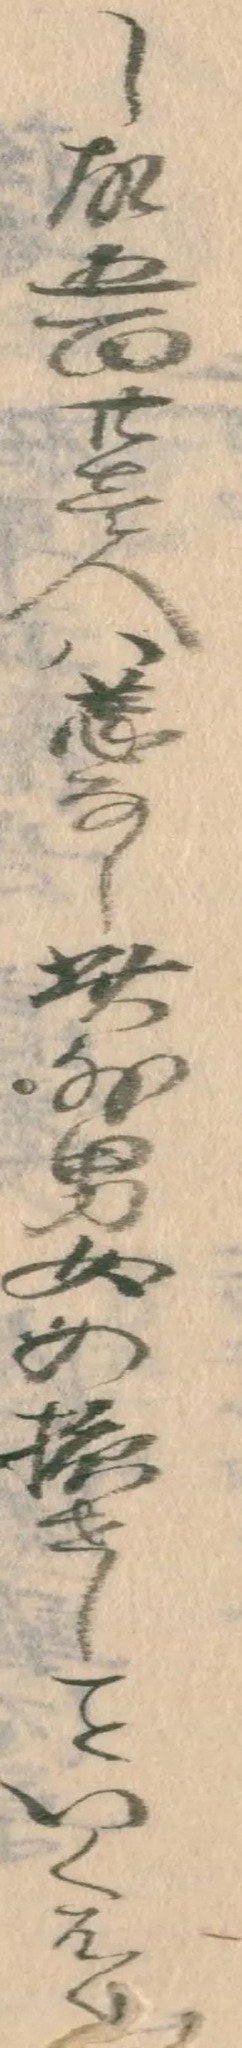し故五百廿壱人ハ恙なし此外男女の損せしこといくはく
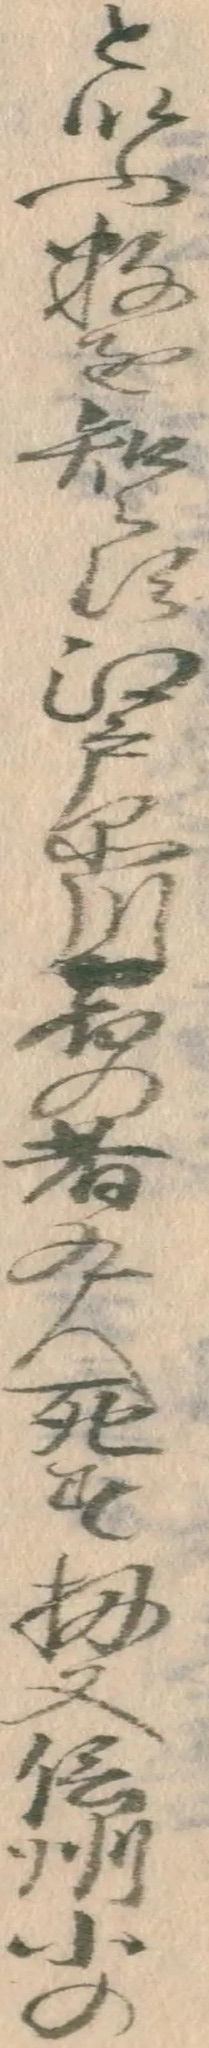といふ数を知らす江戸品川宿の者九人死す扨又信州北の
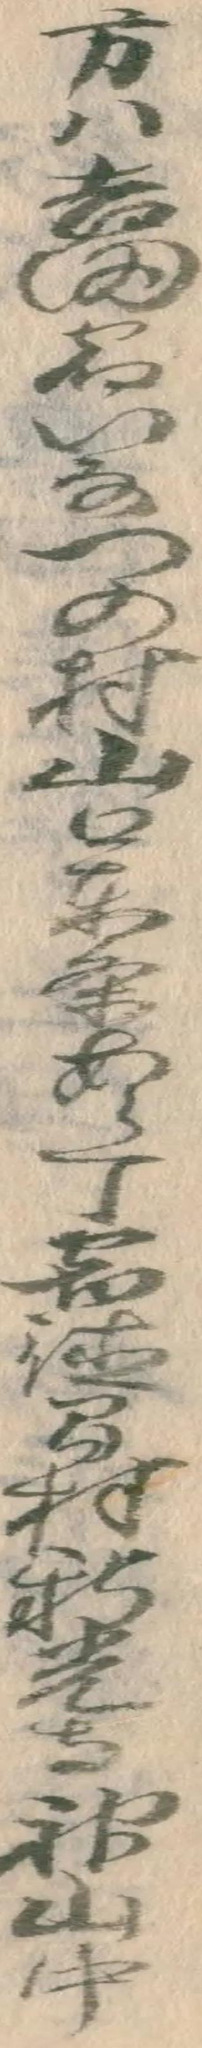方ハ吉田宿いなつの村山口東条あら丁宿徳間村新光寺神山中
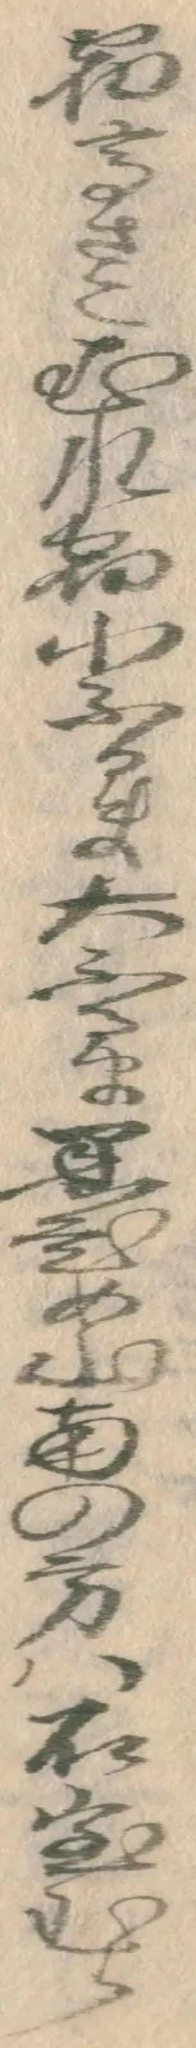宿高さこむれ宿小ふるま大ふるま黒ひめ山南の方ハ石むろむら
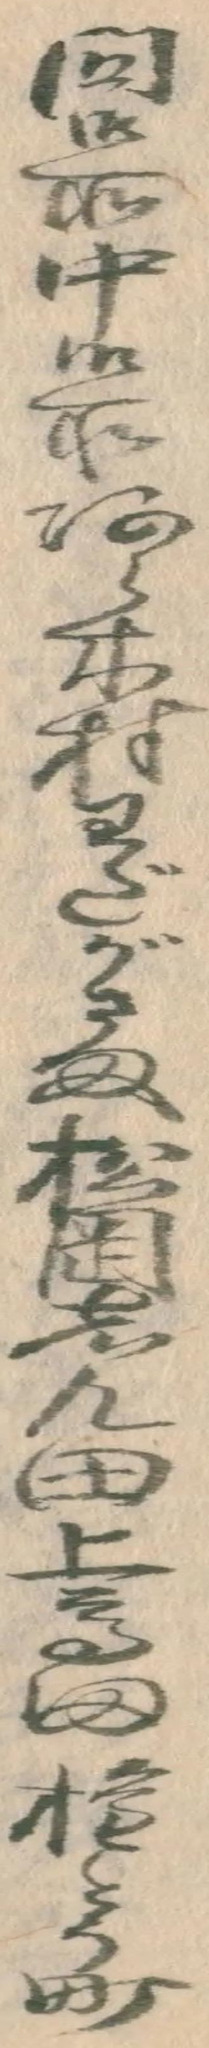問御所中御所あら木村わだぐさま松岡しん田上高田権とう町
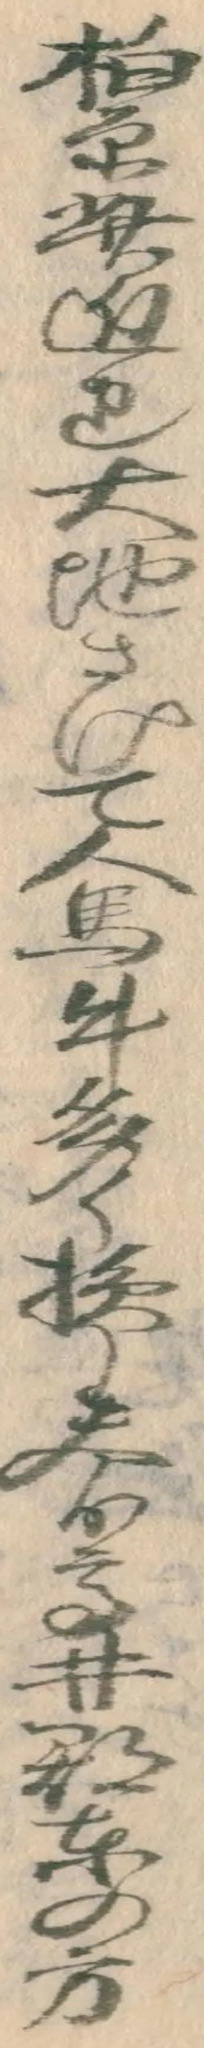柏原此辺迄大地さけて人馬牛多く損し夫ゟ髙井郡東の方
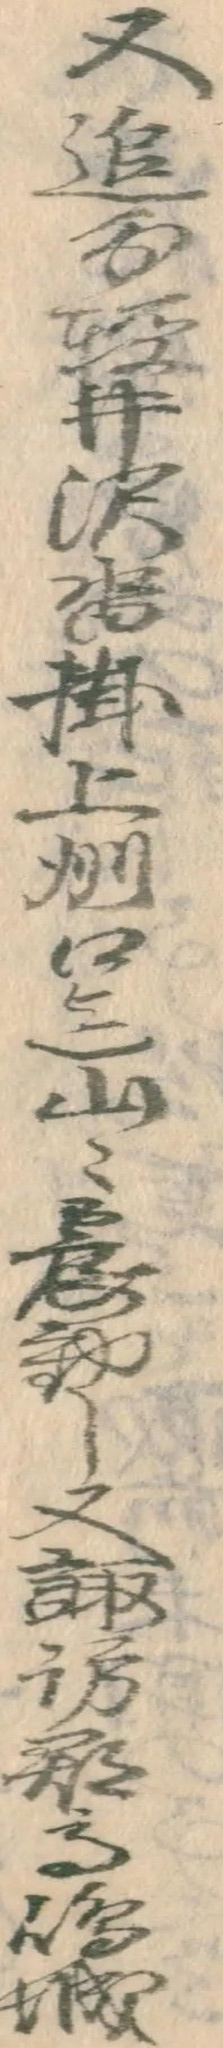又追分軽井沢沓掛上州口まで山々震動し又諏訪郡高嶋城
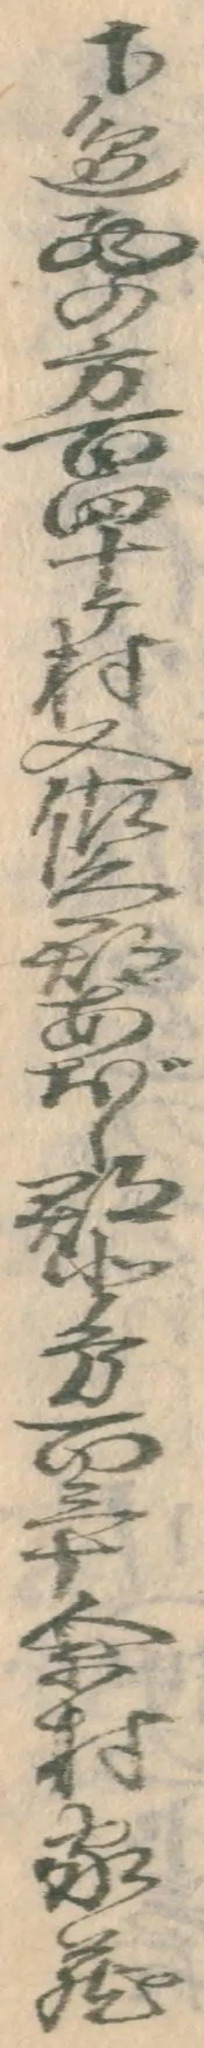下辺西の方百四十ヶ村又佐久郡あず郡北の方百三十余村家蔵
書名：信州大地震之記
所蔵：国立国会図書館 National Diet Library, JAPAN
